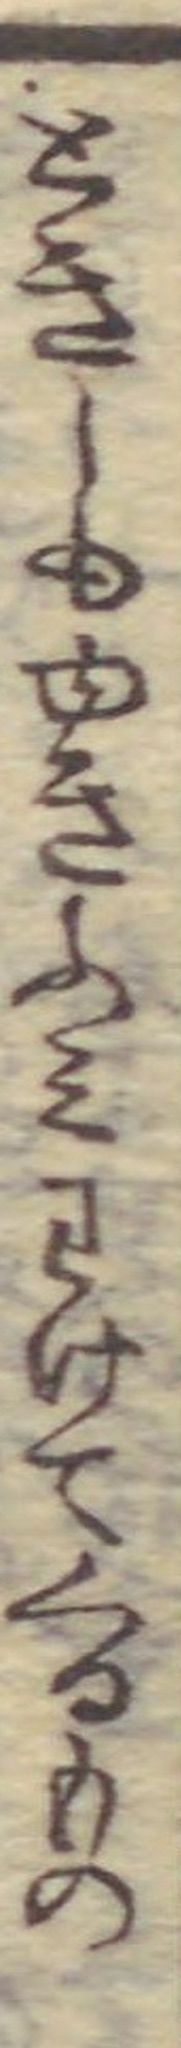ときしもゆきふみわけてくるもの
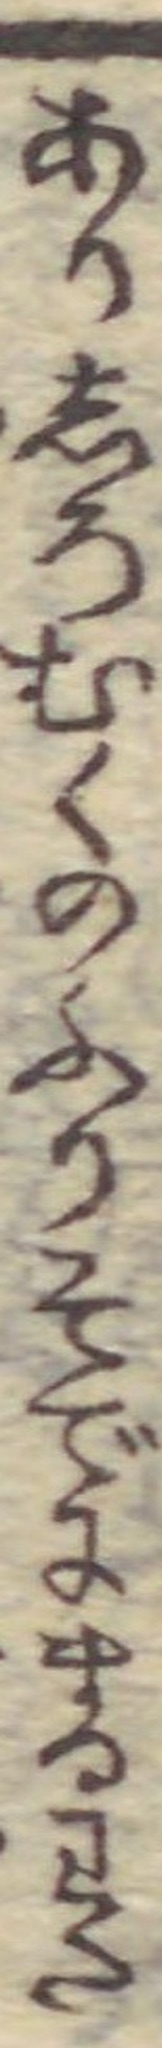ありしろむくのふりそでにまるわた
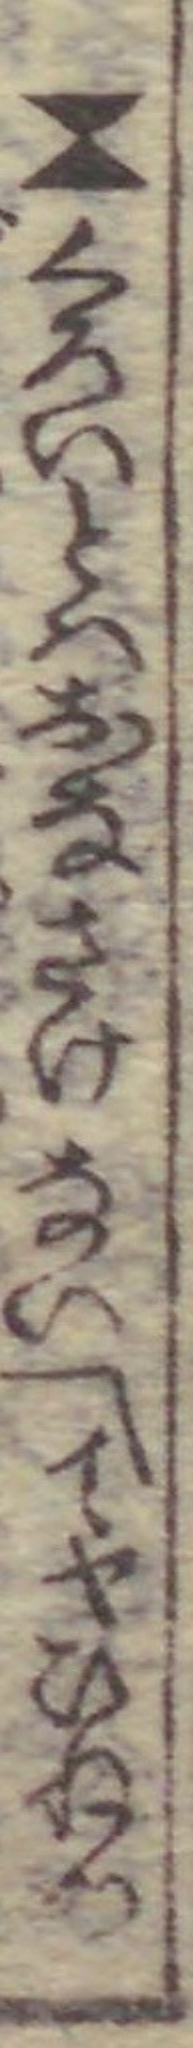▼▲くろいとはおなさけない〽イヽヤひねつ
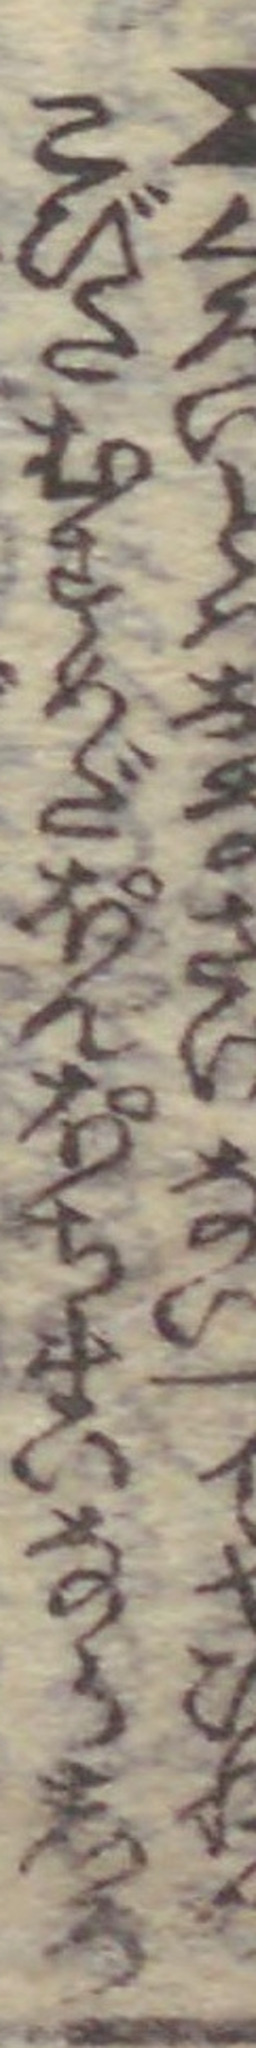こびたむすめだぽんぽんちまいならしろ
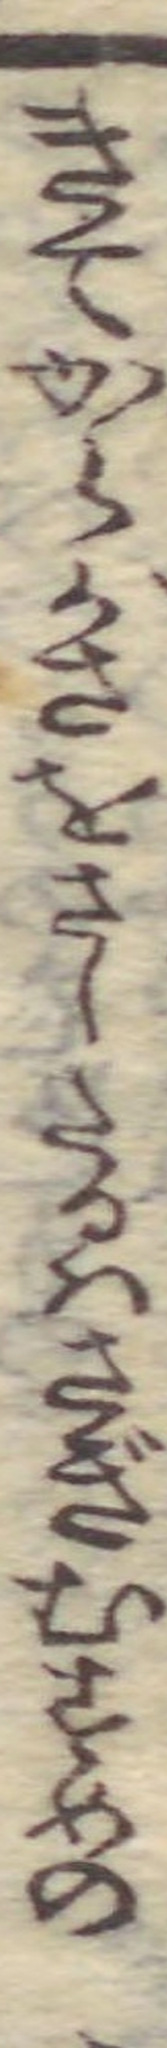きてからかさをさしたるはさぎむすめの
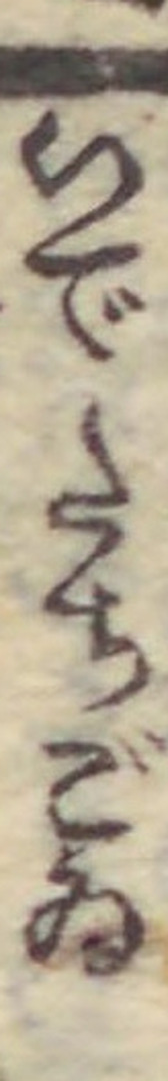いでたちごゐ
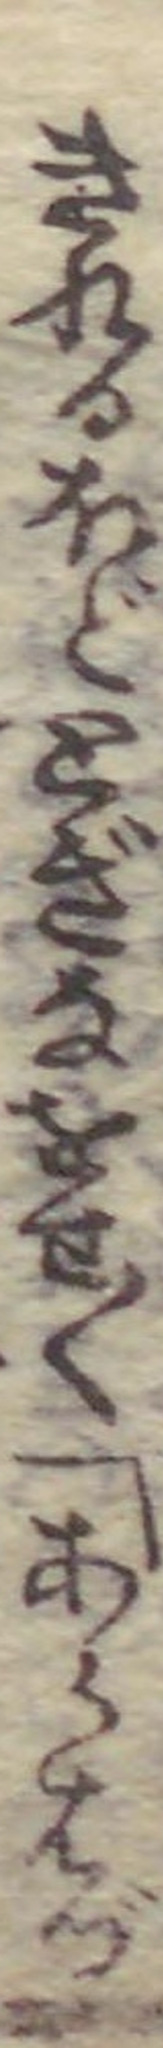きれるほどとぎなをせ〳〵〽あらはづ
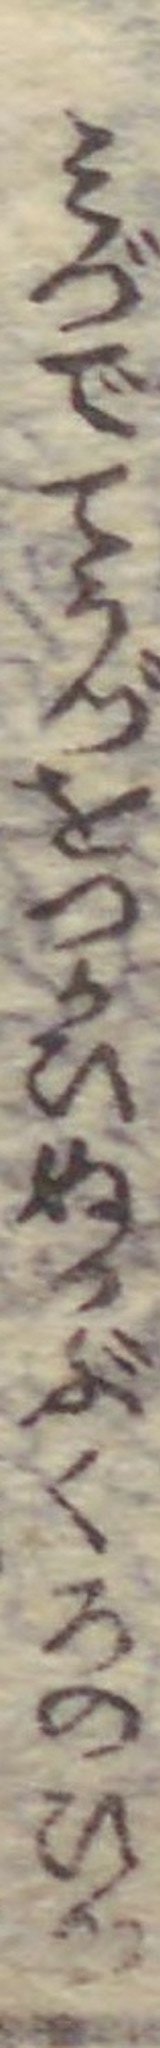みづでてうづをつかひぬかぶくろのひつ
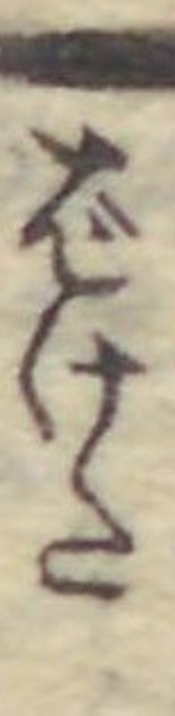ばけた
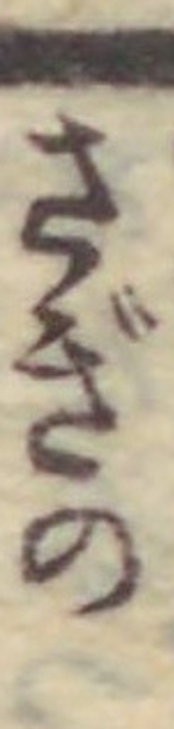さぎの
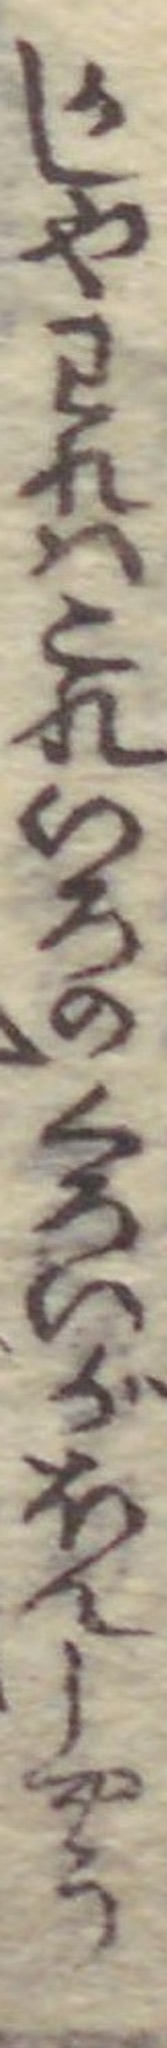かしやわれはこれいろのくろいがほんしやう
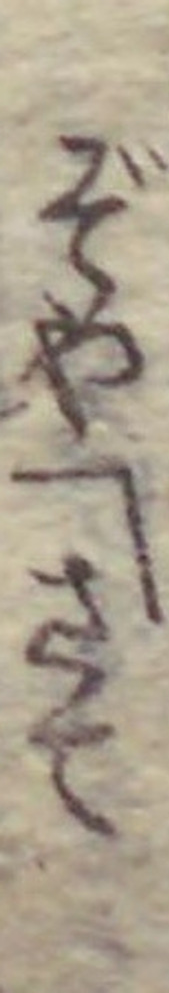ぞや〽さて
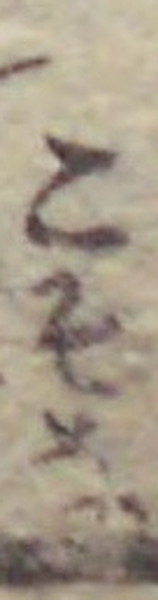こそな
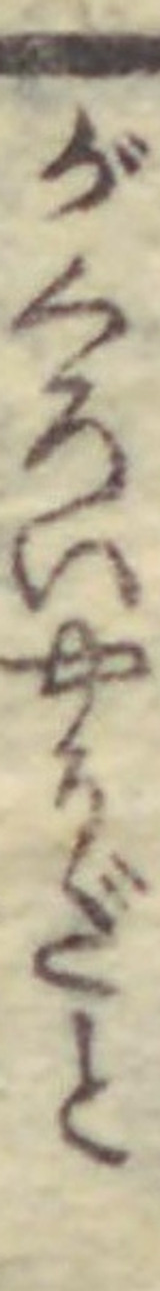がくろいやうだと
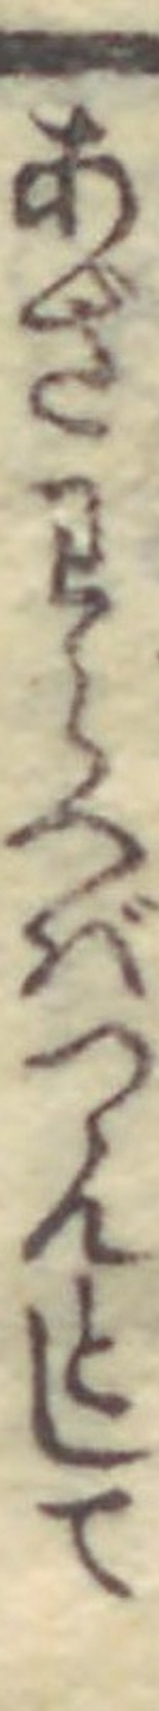あざわらへばつんとして
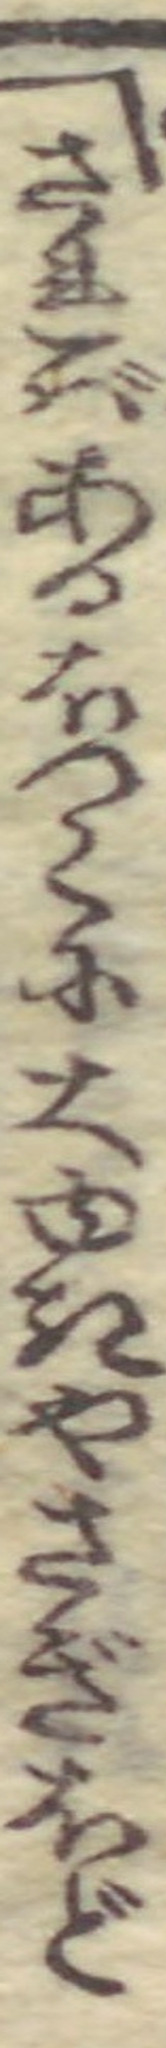〽さればあるほつくに大ゆきやさぎほど
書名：大時代唐土化物 3巻. 曽我太夫染
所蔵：国立国会図書館 National Diet Library, JAPAN
